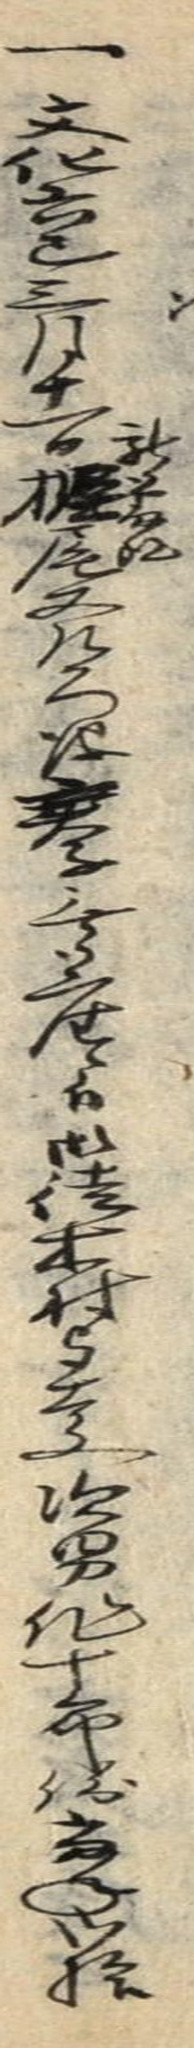一文化六巳三月十一日新番組樫尾又左衛門儀実子無御座候ニ付御徒木村与太夫次男作十郎儀当年弐拾
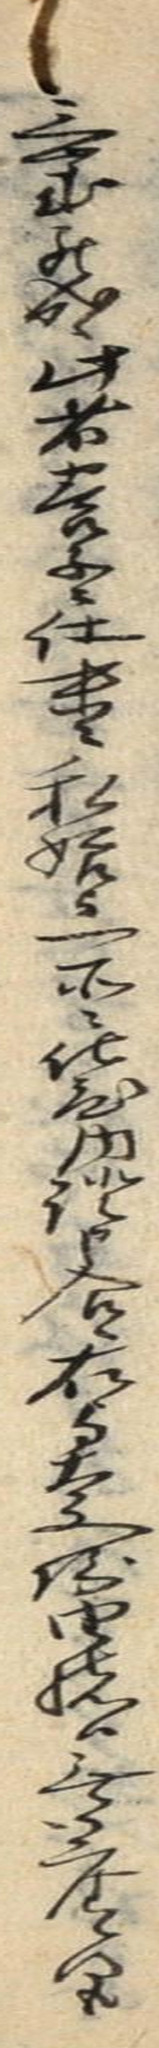三歳罷成候此者養子ニ仕末々私娘与一所ニ仕度内談申合候右与太夫儀由緒ハ無御座候得共

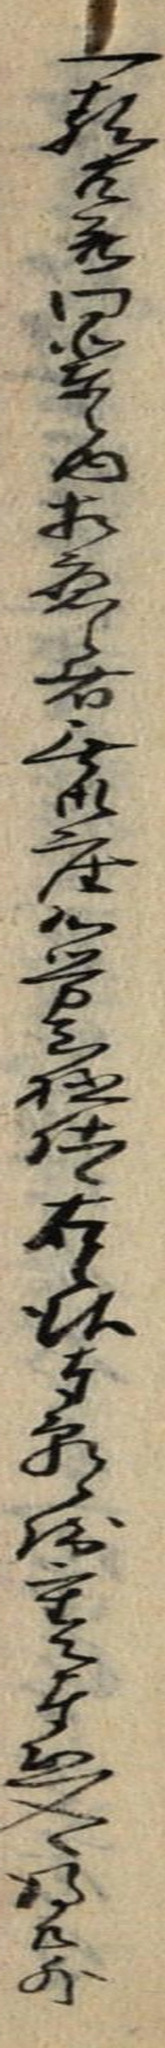一類共并同輩之内相応候者無御座心労至極仕候右之趣奉願候儀重々奉恐入候得共外
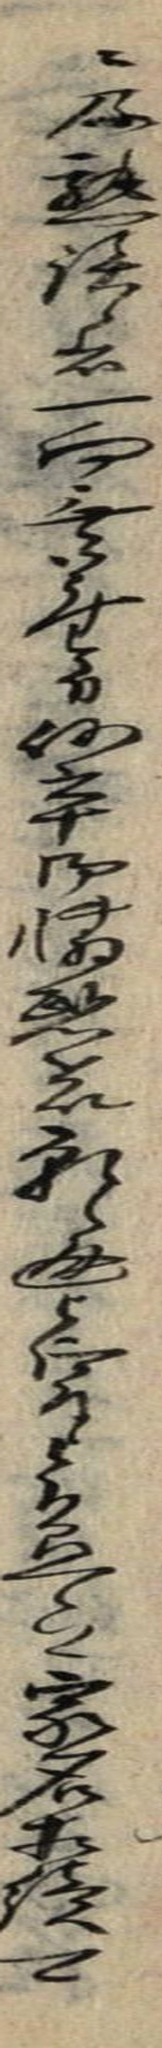ニ及熟談候者一向無御座ニ付何卒御憐憫を以願之通被仰付被下置候ハヽ家名相続可
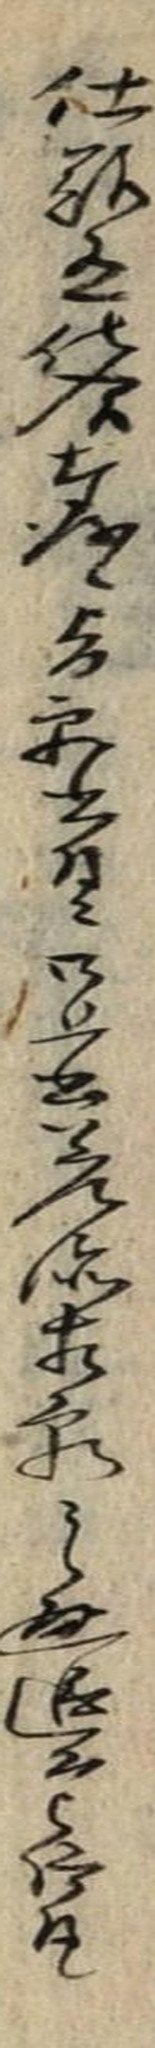仕難有仕合奉存候旨願書付ニ口上書差添相願之通追而被仰付候
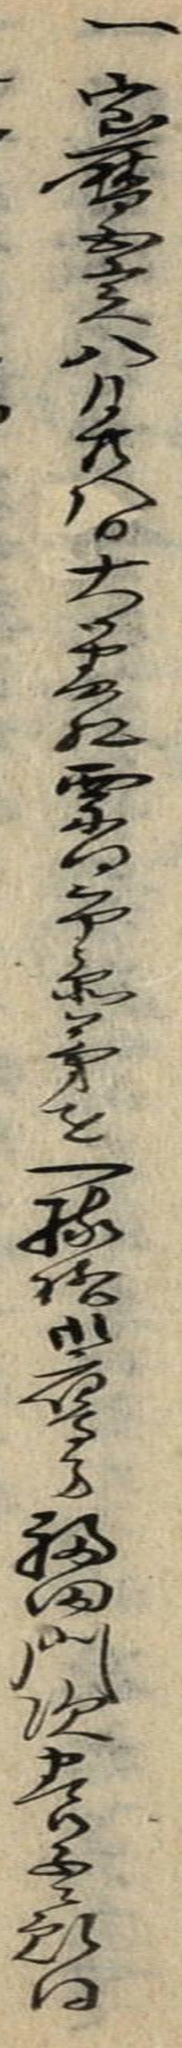一宝暦五寅八月廿八日大御番組栗田兵衛弟を一統格御鷹方福田門次養子ニ願同
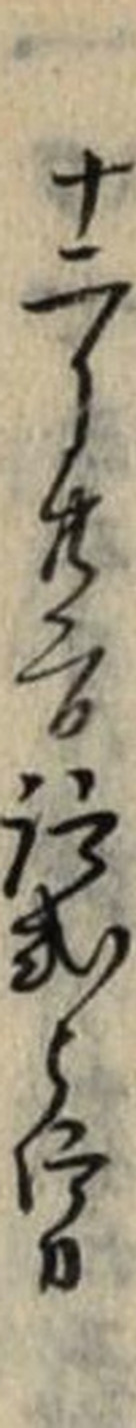十二月廿ニ日跡式被仰付
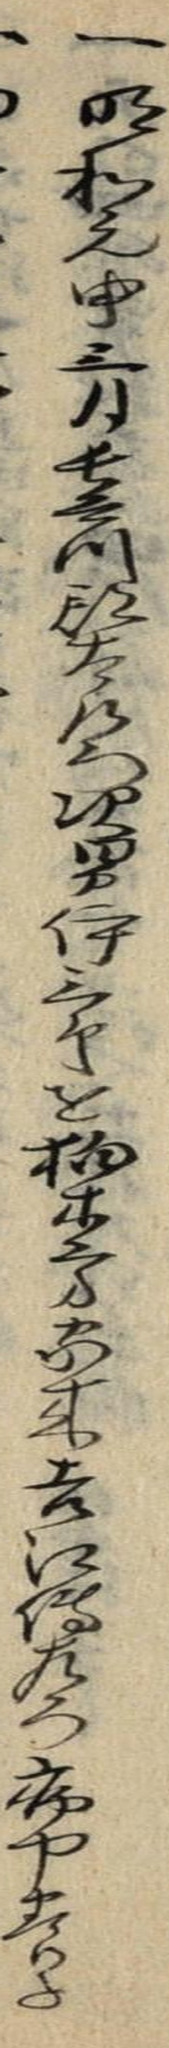一明和元申三月長谷川郡太郎衛門次男伊三郎を狛木方家来吉江伝左衛門病中養子
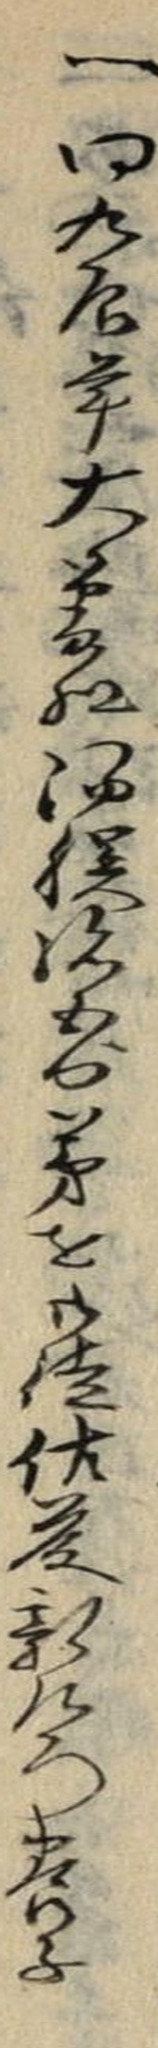一同九辰年大御番組俣弥五郎弟を御徒佐藤新左衛門養子
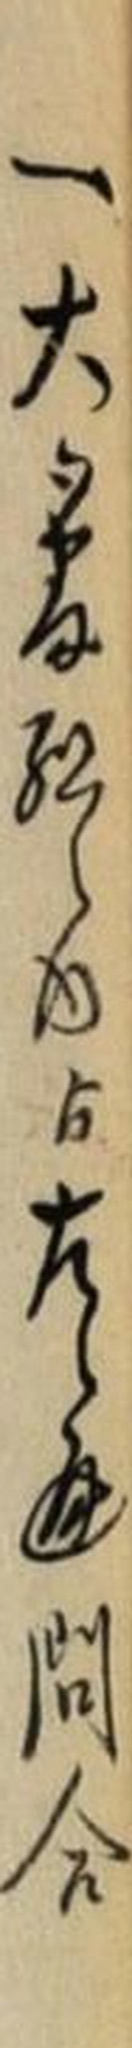一大御番組之内ゟ左之通問合
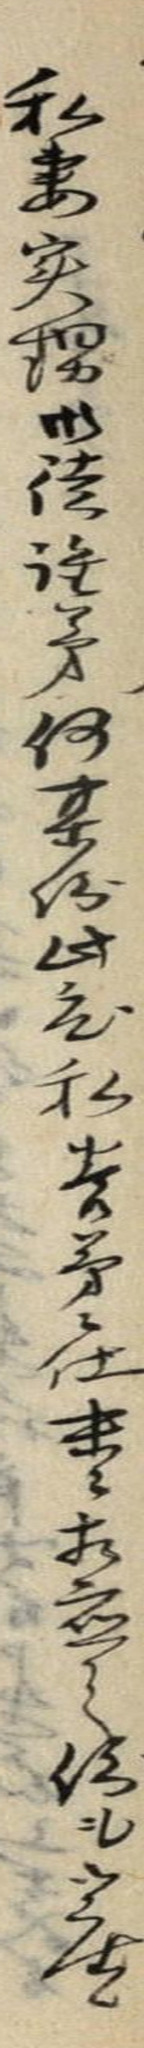私妻実甥御徒誰弟何某儀此度私養弟被仕末々相応之儀も御座候
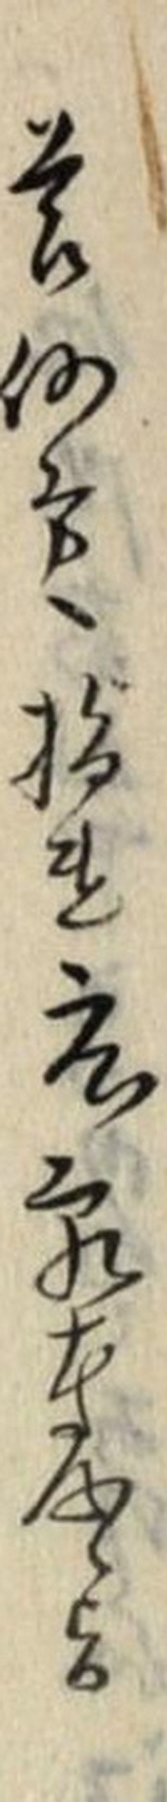節何方へ指遣度願奉存候旨
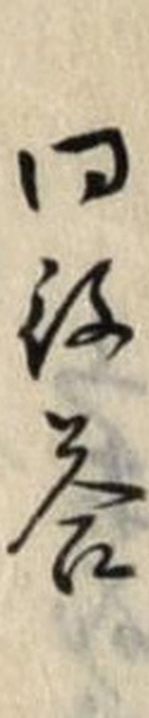同役答
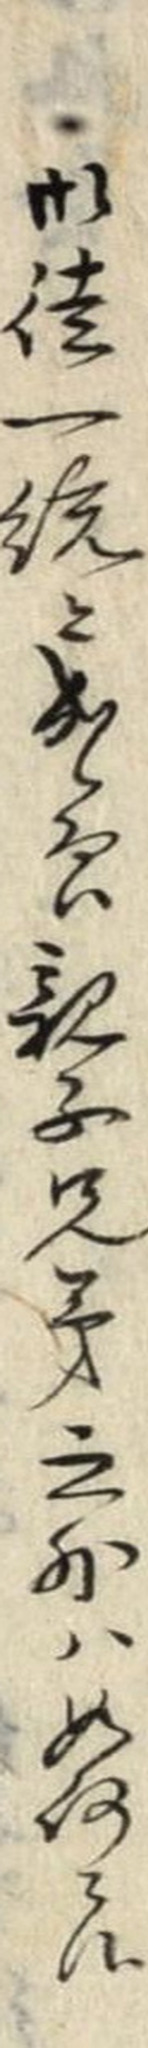・御徒一統と成候而ハ親子兄弟之外ハ如何候哉
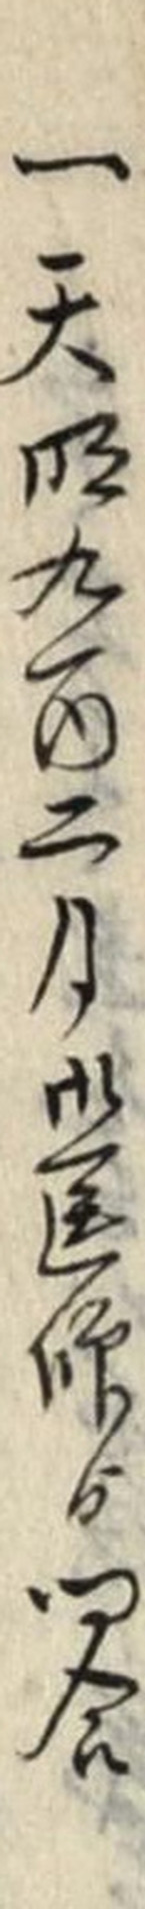一天明九酉二月御医師ゟ問合
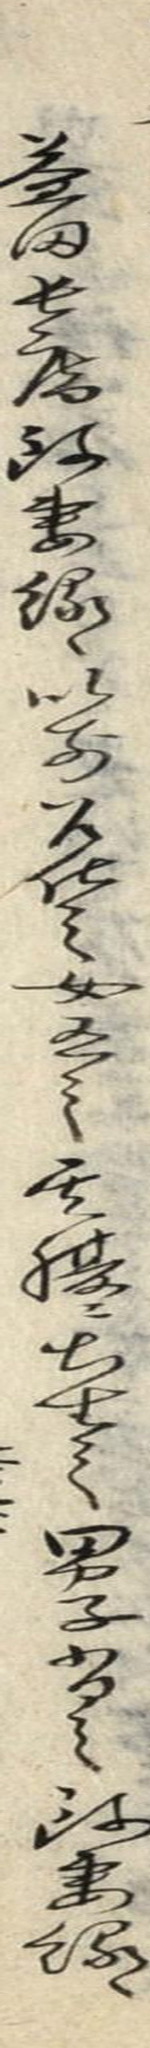益田長庵致妻縁候以前召仕之女有之其腹ニ出生之男子有之致妻縁候
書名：養子縁組之部
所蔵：福井県文書館 Fukui Prefectural Archives
